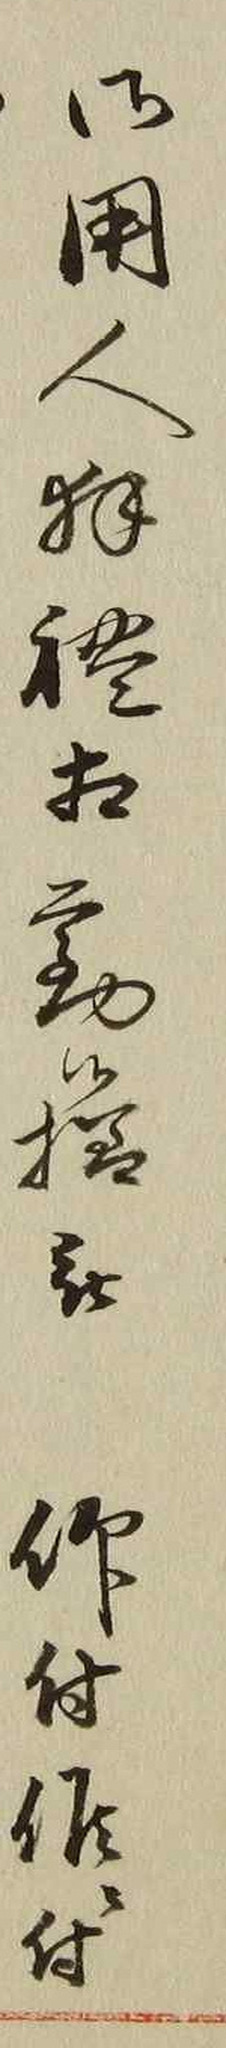御用人拝礼相勤候様被仰付候に付
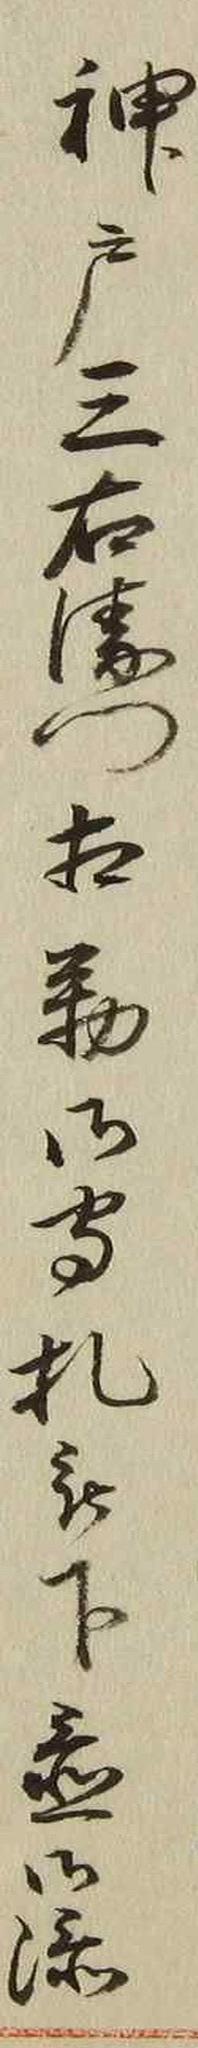神戸三右衛門相勤御守札被下置御添
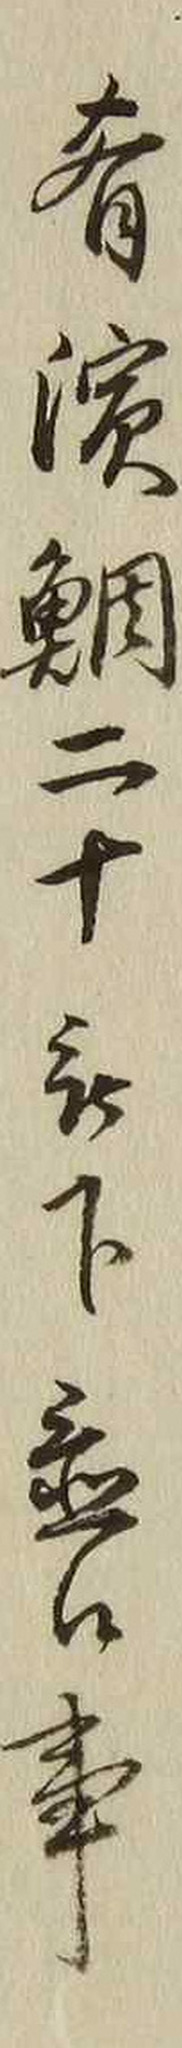魚濱鯛二十被置候事
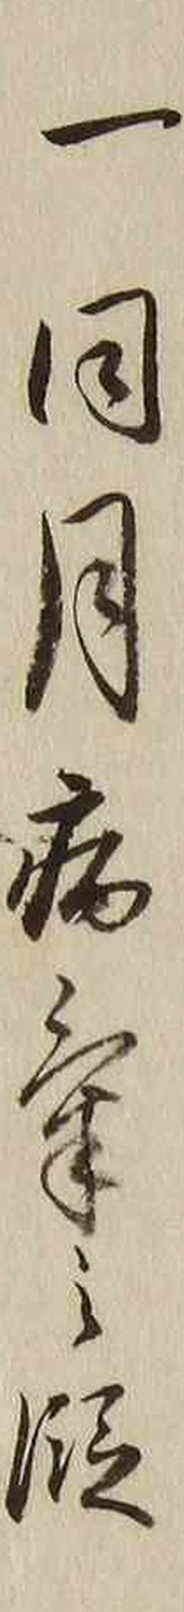一同月病気之段
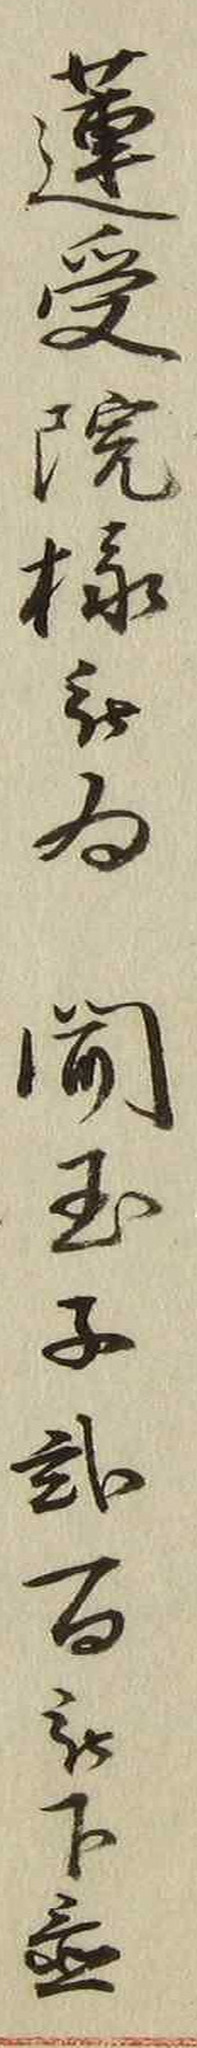蓮受院様被為聞玉子弐百被下置
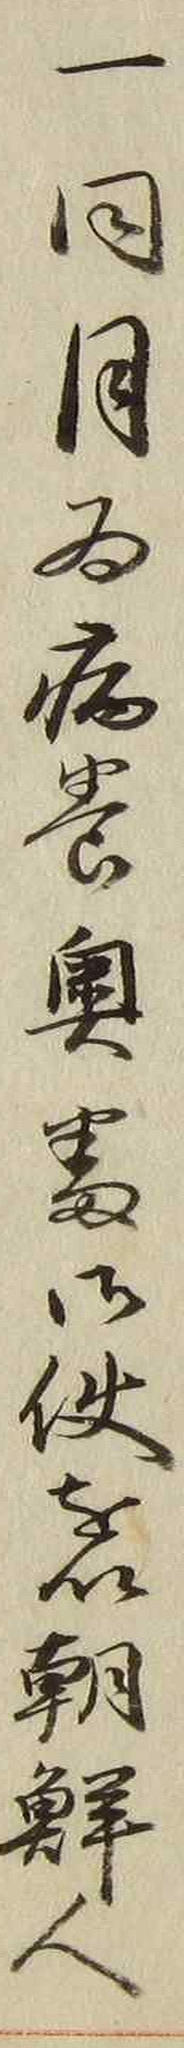一同月為病気奥番御使を以朝鮮人
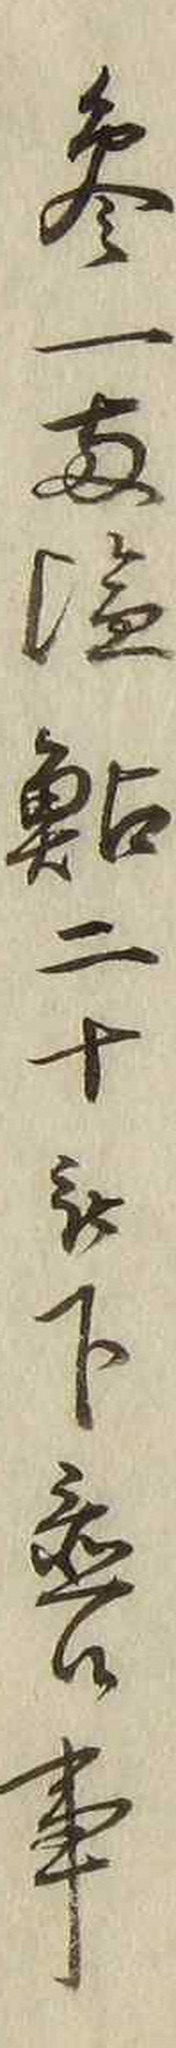参一両塩鮎二十被下置候事
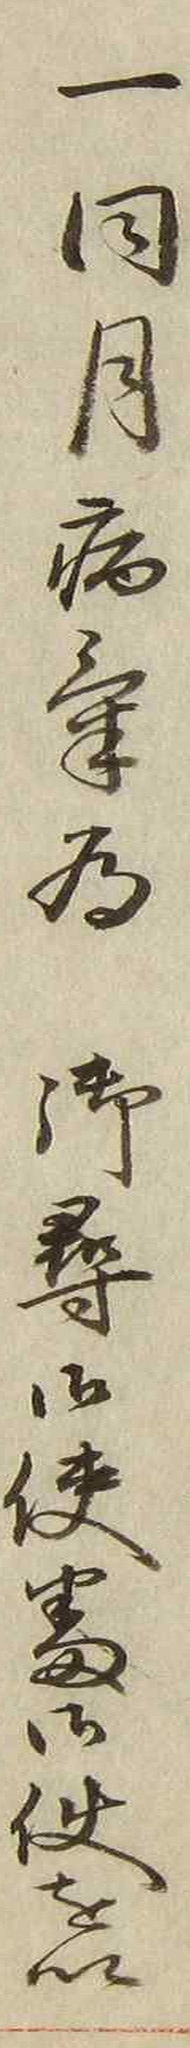一同月病気為御尋御使番御使を以
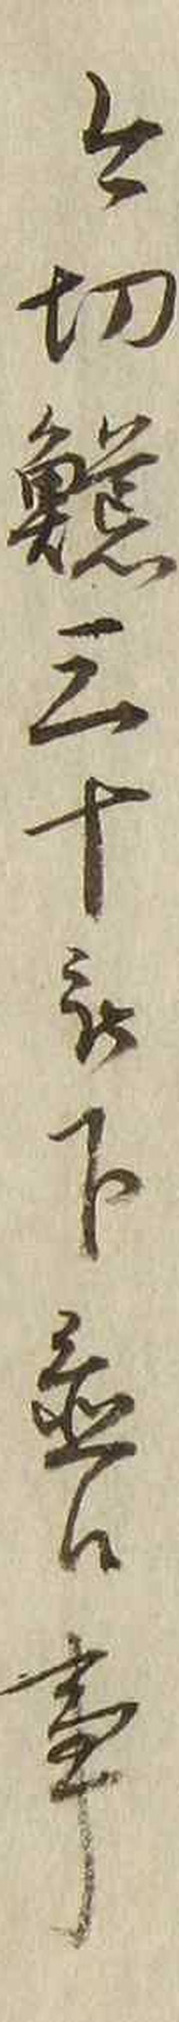今切三十被下置候事

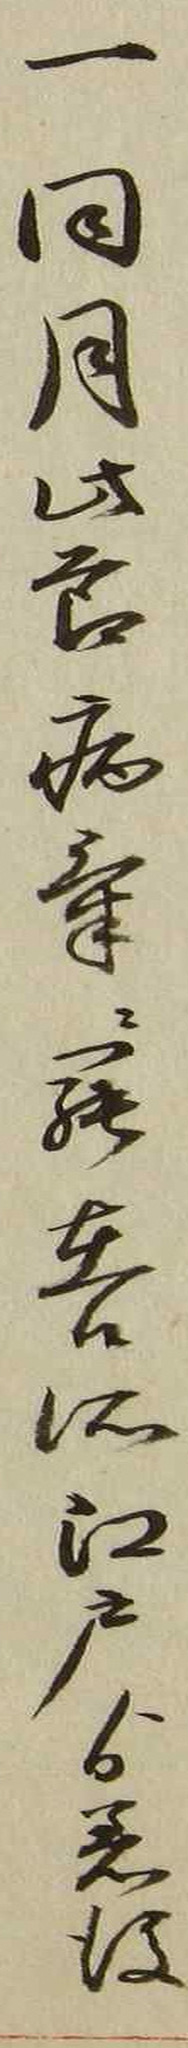一同月此節病気に罷在候所江戸ゟ着後
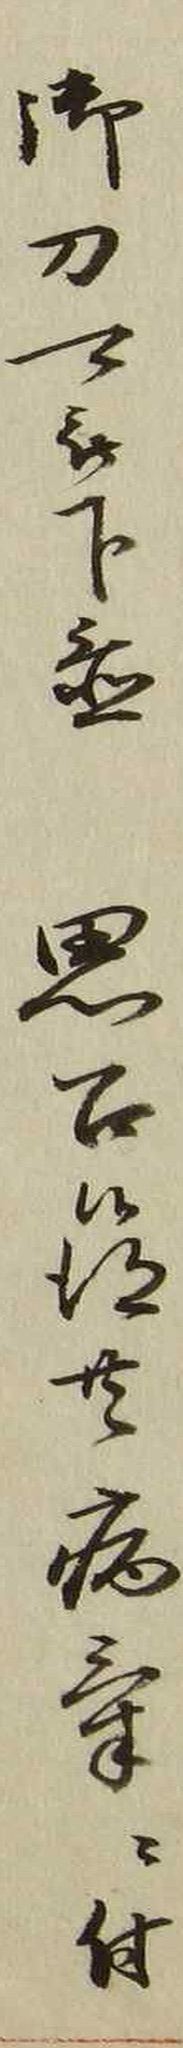御刀可被下置思召候得共病気に付
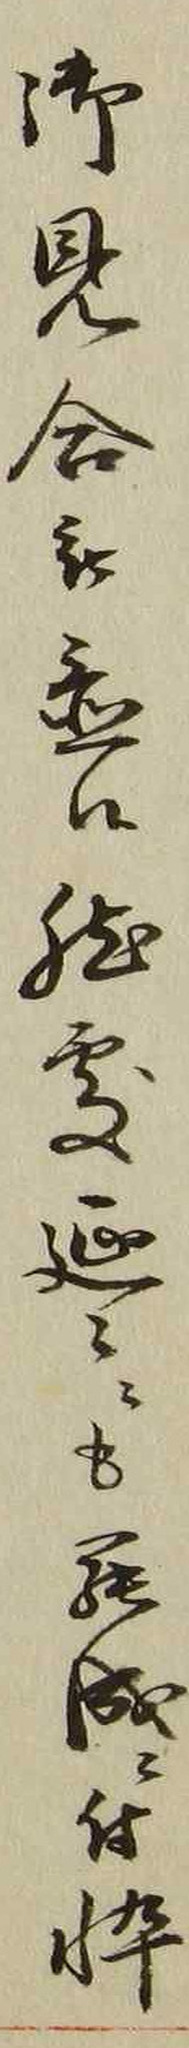御見合被置候然処延々にも罷成に付忰
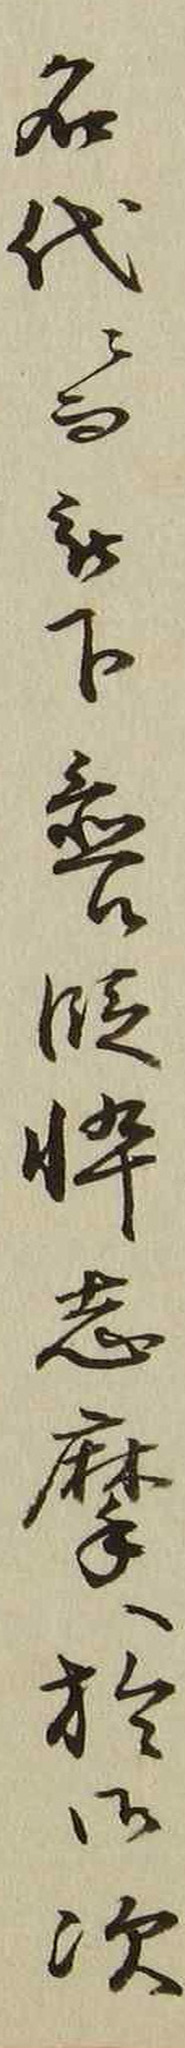名代に而被下置候段忰志摩へ於御次
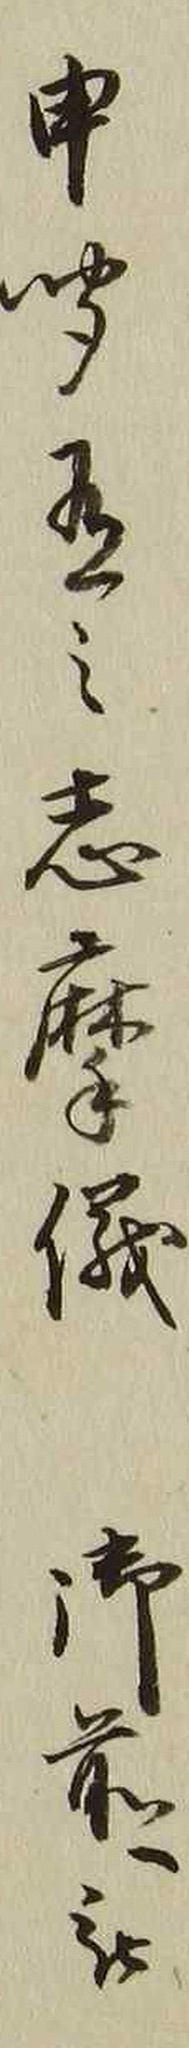申聞有之志摩儀御前被
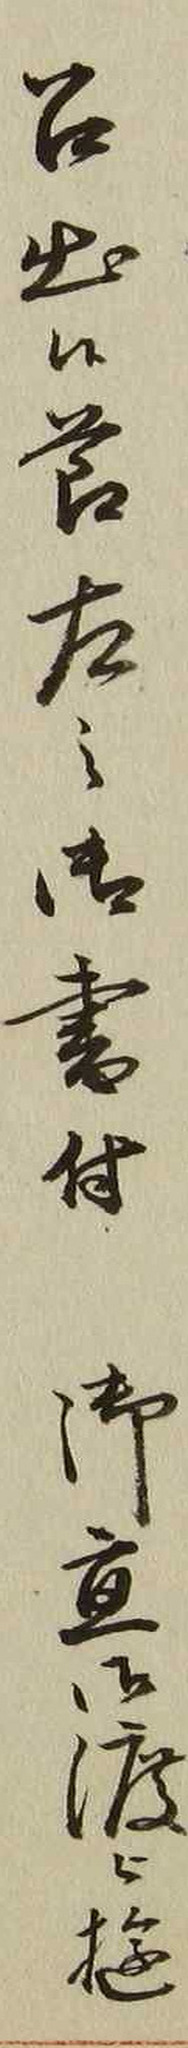召出候節右之御書付御宣御渡被遊
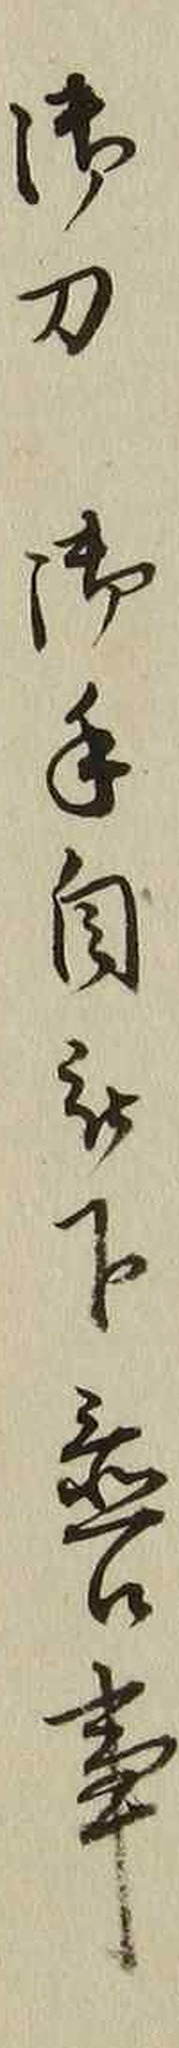御刀御手自被下置候事
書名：諸士系譜　巻之125　た之部1
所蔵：会津若松市立会津図書館
